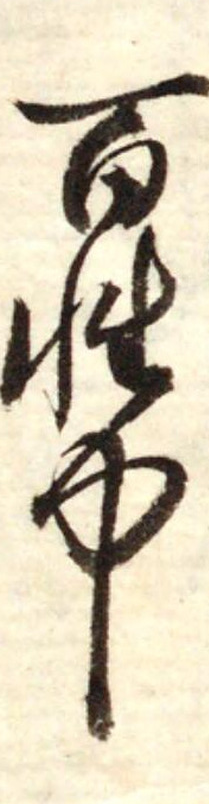百姓中
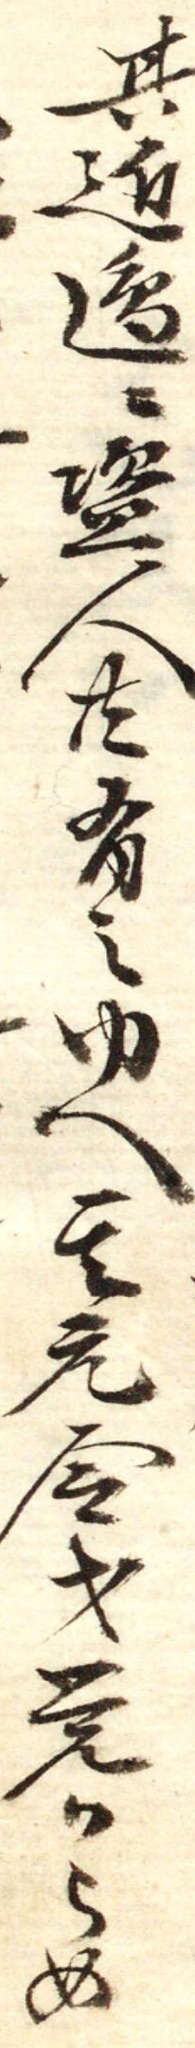其近辺に盗人共有之ゆへ其許令才覚からぬ
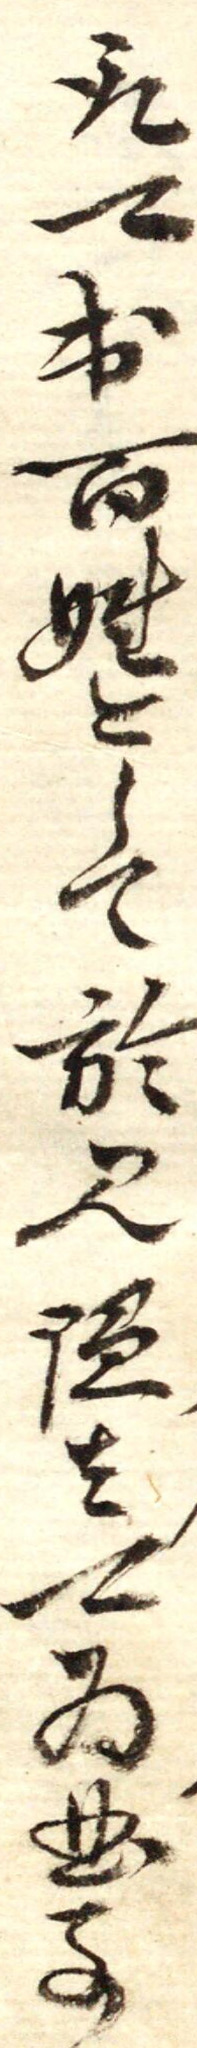取可出百姓として於見隠を可為曲事請

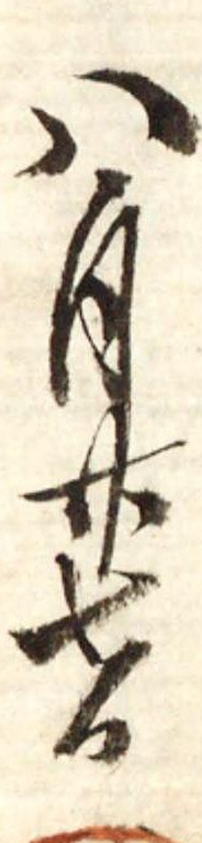八月廿七日
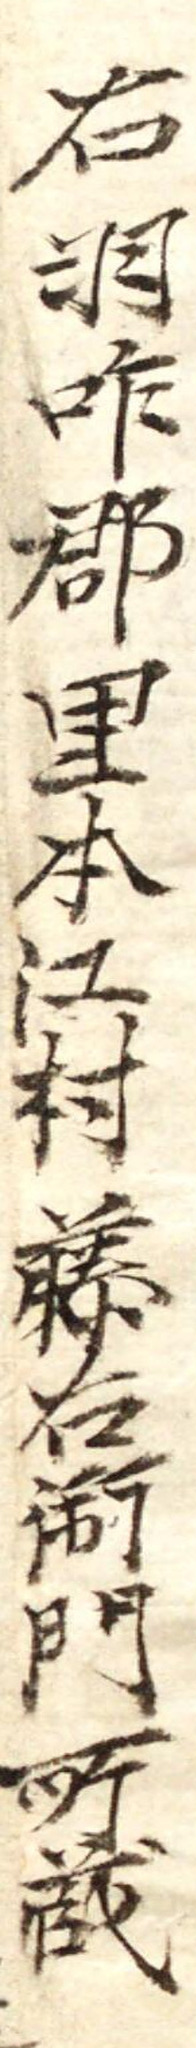右羽咋郡里本江村藤右衛門所蔵
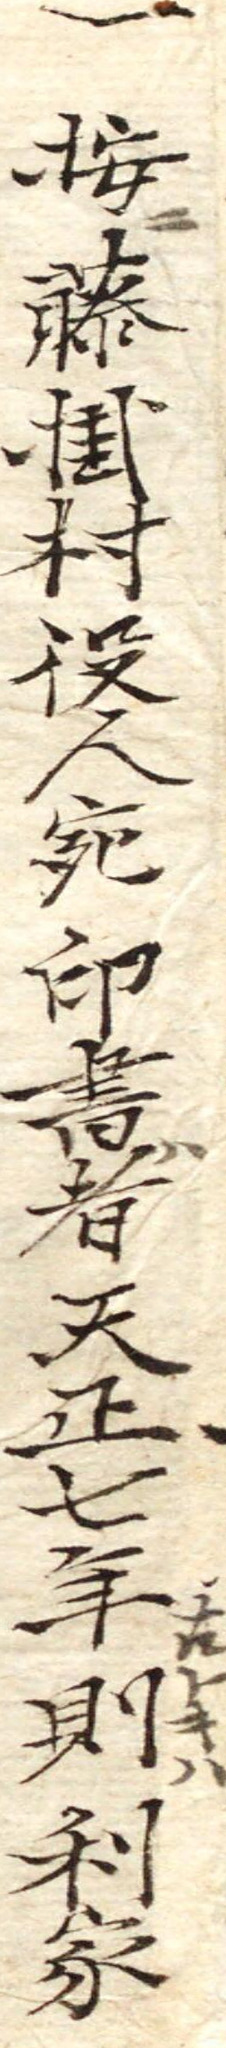一按に藤掛村役人宛印書者天正七年則利家
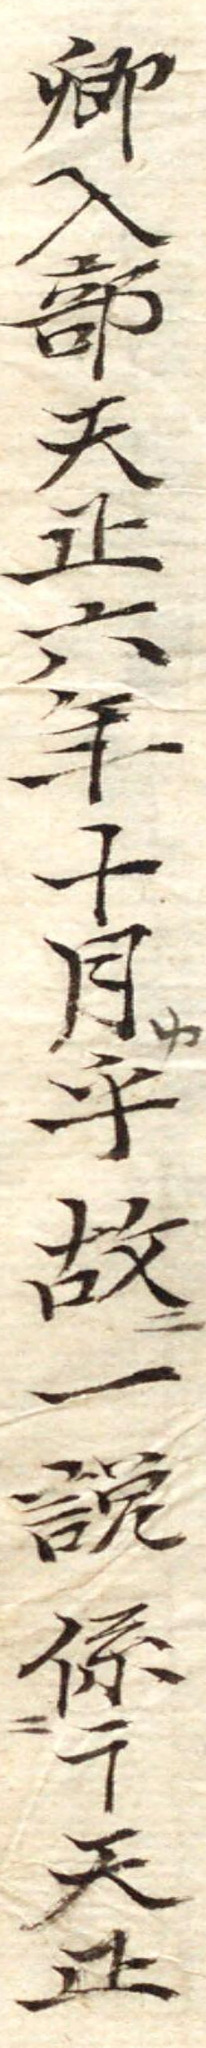卿入部天正六年十月故乎故に一説係干天正
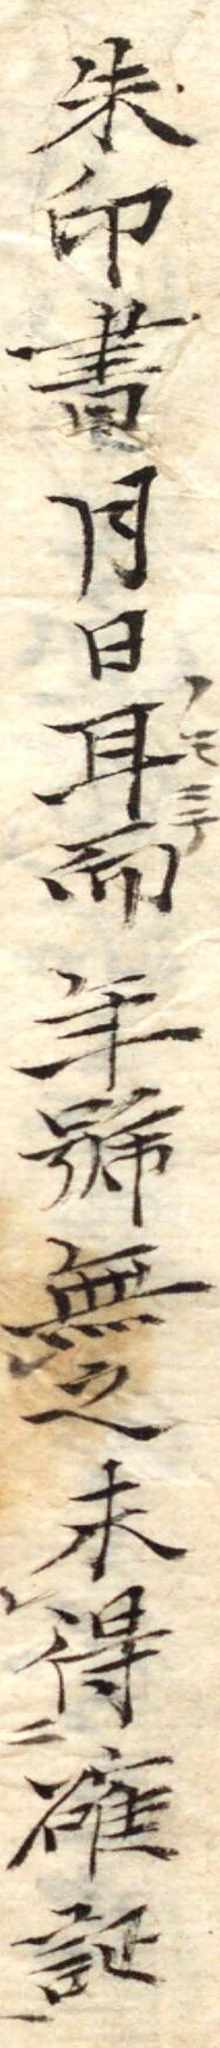朱印書月日耳而年號無之未得確証
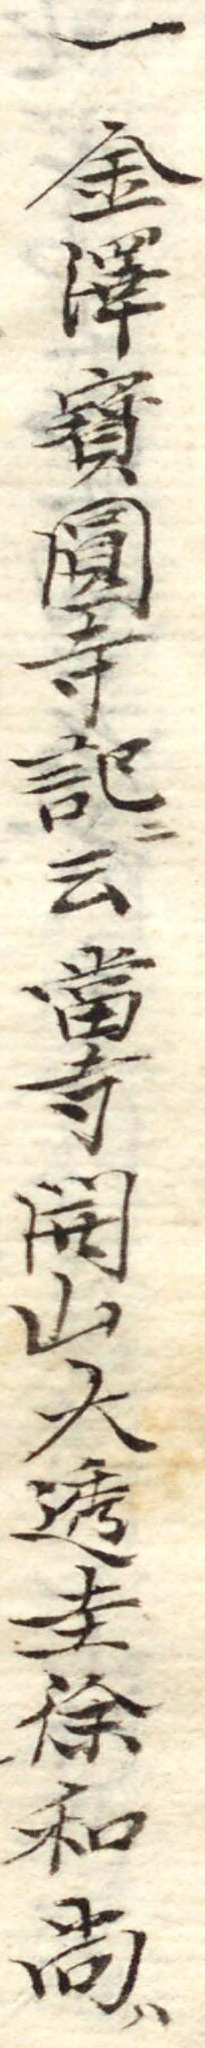一金澤寶圓寺記に云当寺開山大透圭所徐和尚
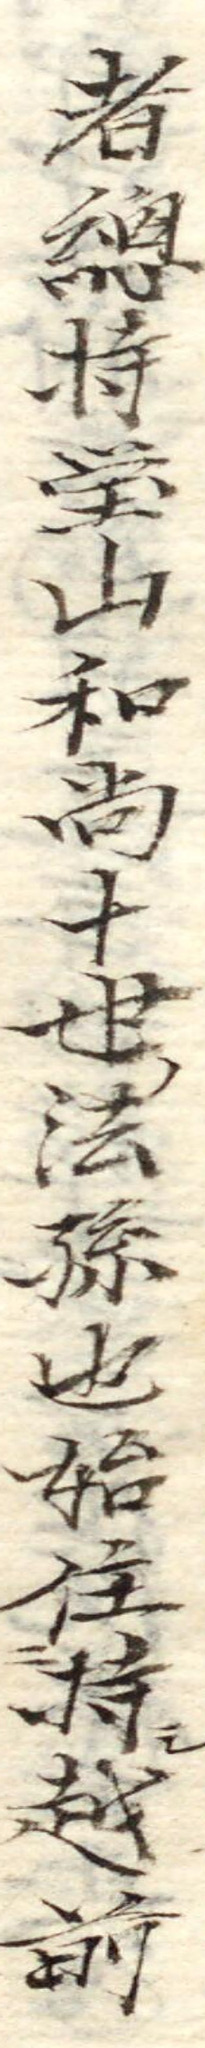者総持螢山和尚十世の法孫也始住持し越前
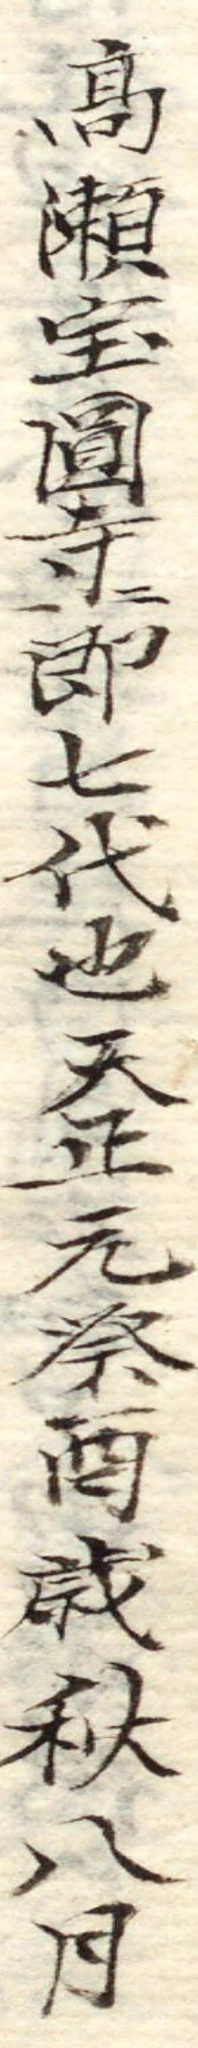高瀬宝圓寺に即七代也天正元癸酉歳秋八月
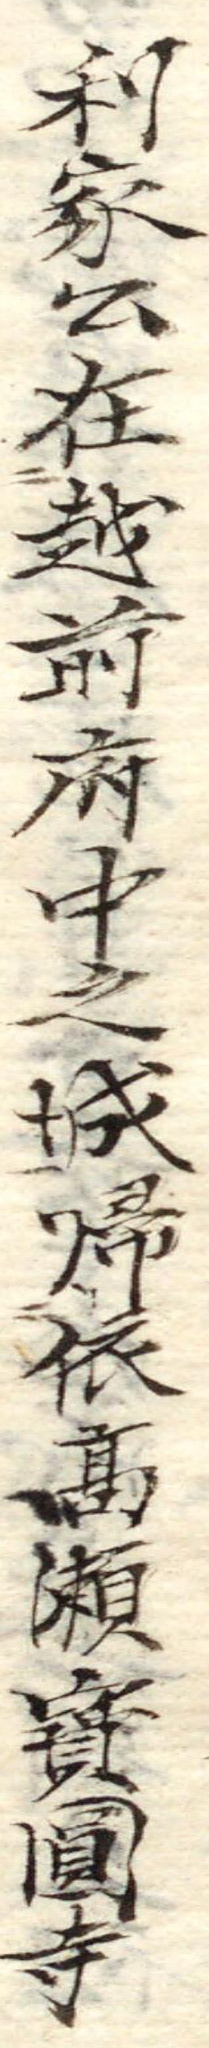利家公在越前府中之城帰依高瀬寶圓寺
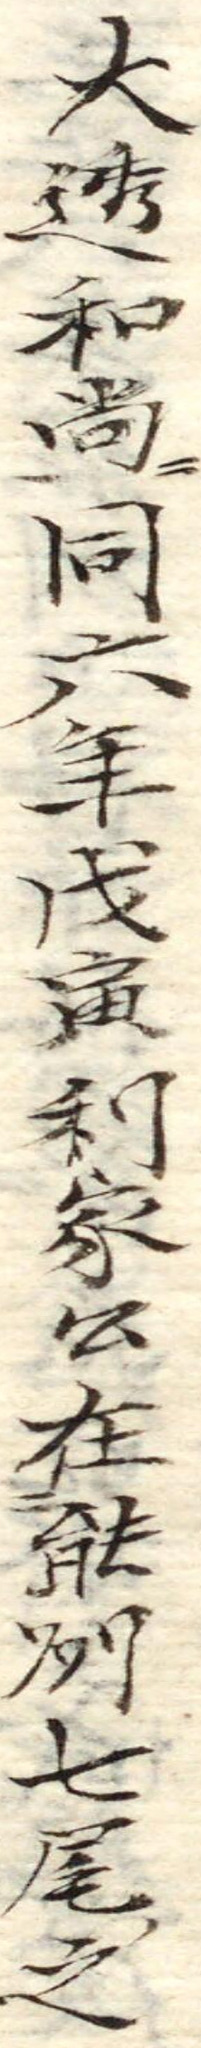大透和尚に同六年戌寅利家公在能州七尾之
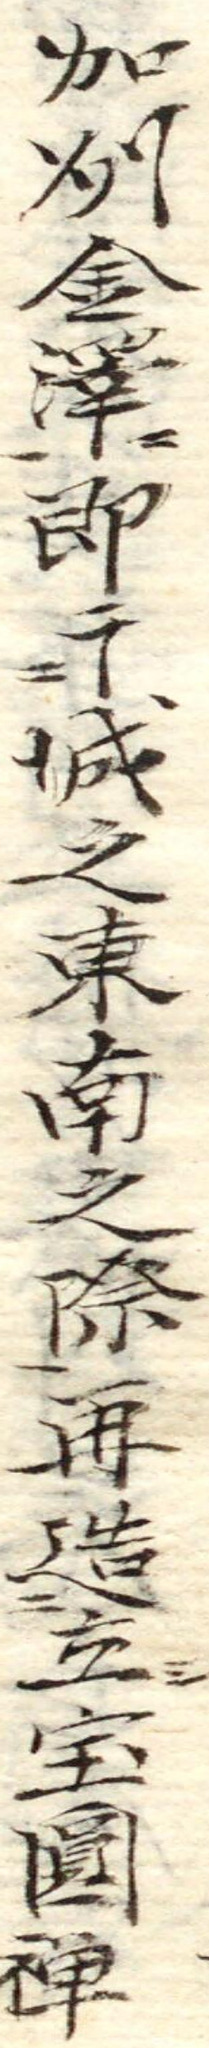加州金沢に即干城之東南之際再造立し宝圓禅
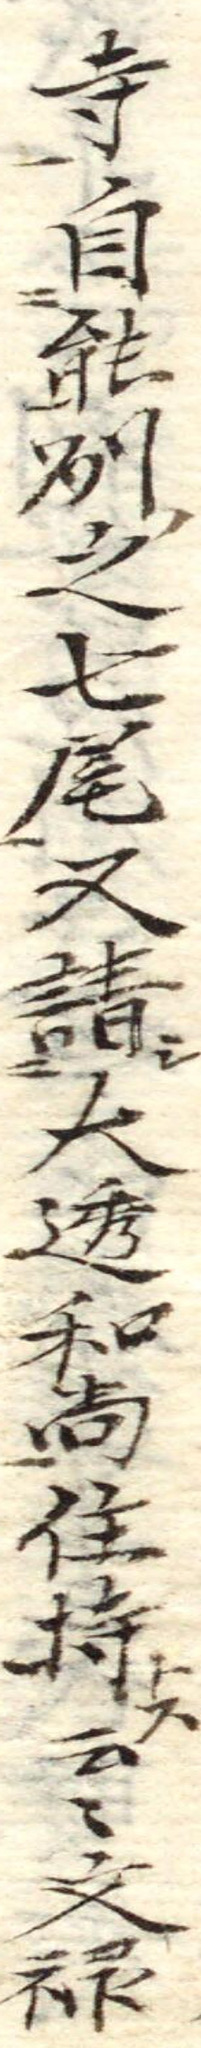寺自能州之七尾又請し大透和尚住持とす云々文禄
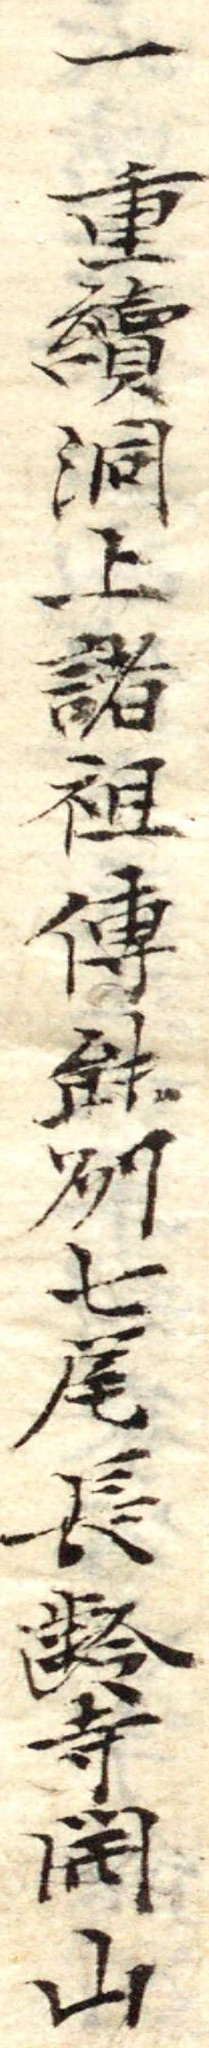一重續洞上諸祖伝能州七尾長齢寺開山
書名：前田家封国証書集録
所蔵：Ishikawa Prefectural Library
